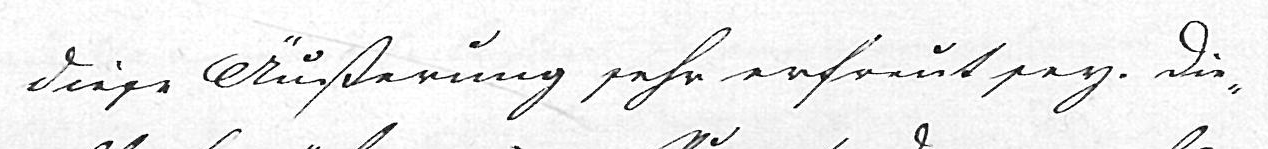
diese Äußerung sehr erfreut sey. Die-
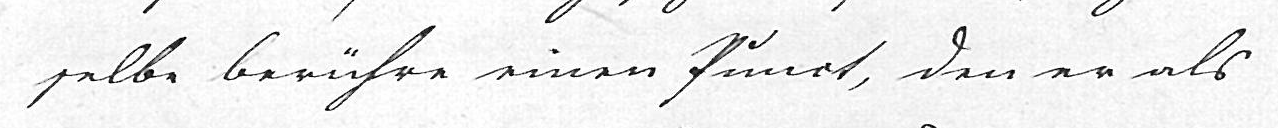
selbe berühre einen Punct, den er als
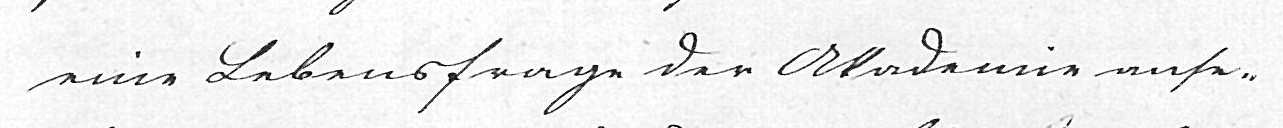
eine Lebensfrage der Akademie anse-
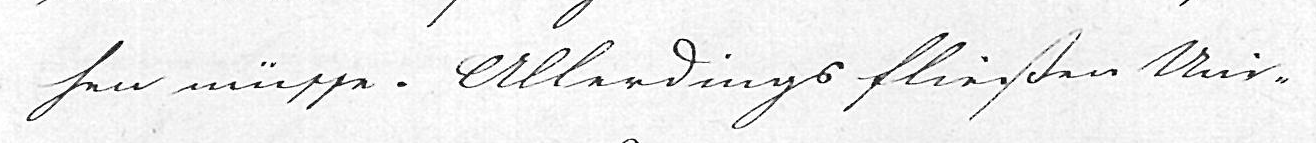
hen müsse. Allerdings fließen Uni-
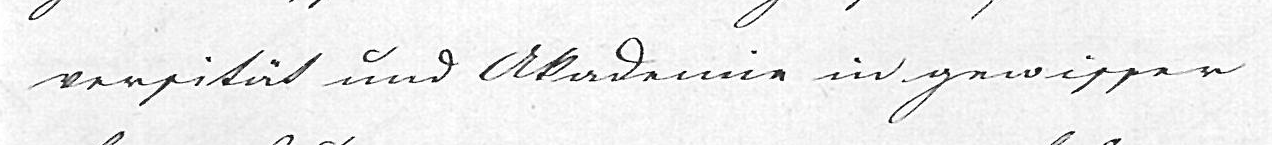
versität und Akademie in gewisser
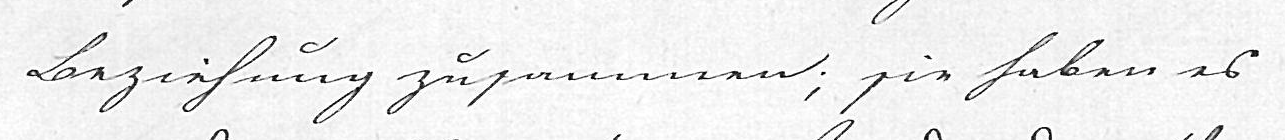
Beziehung zusammen, sie haben es
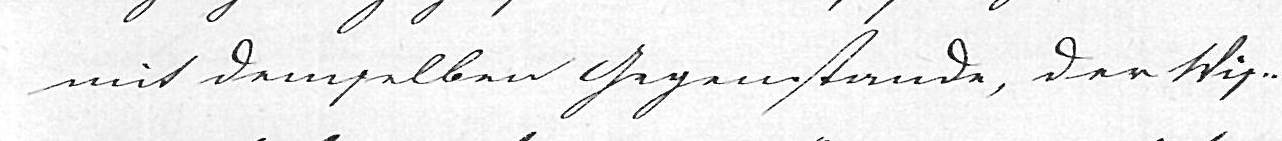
mit demselben Gegenstande, der Wis-
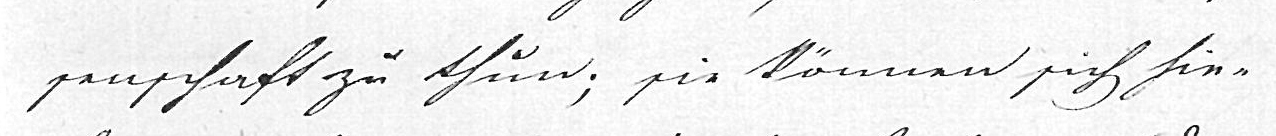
senschaft zu thun; sie können sich hie-
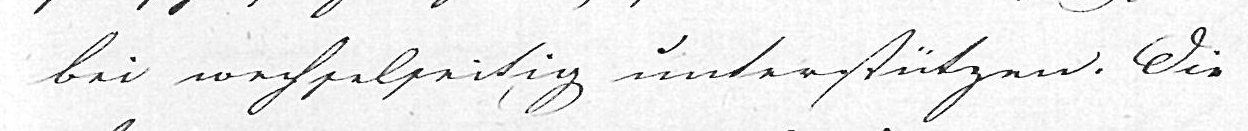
bei wechselseitig unterstützen. Die
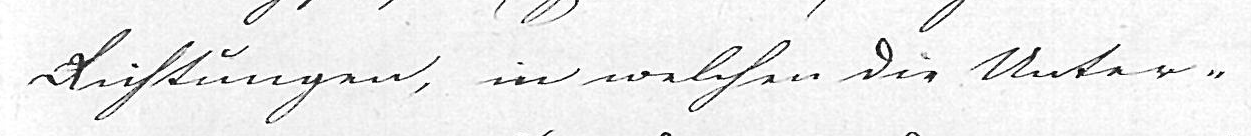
Richtungen, in welchen die Unter-
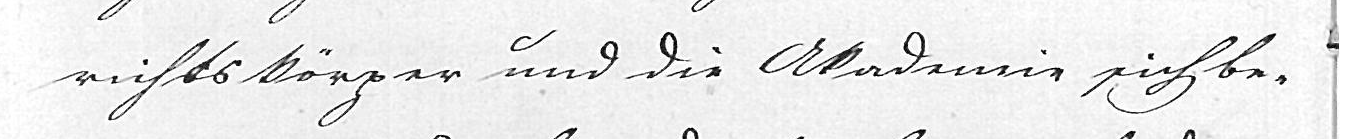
richtskörper und die Akademie sich be-
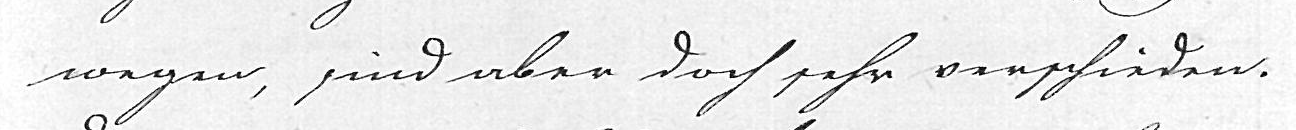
wegen, sind aber doch sehr verschieden.
